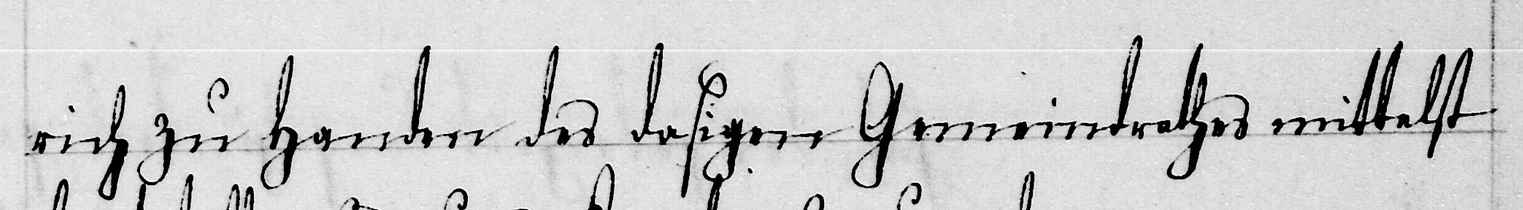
rich zu Handen des dasigen Gemeindrathes mittelst
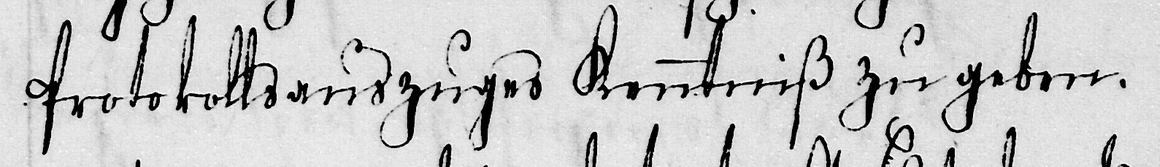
Protokollsauszuges Kenntniß zu geben.
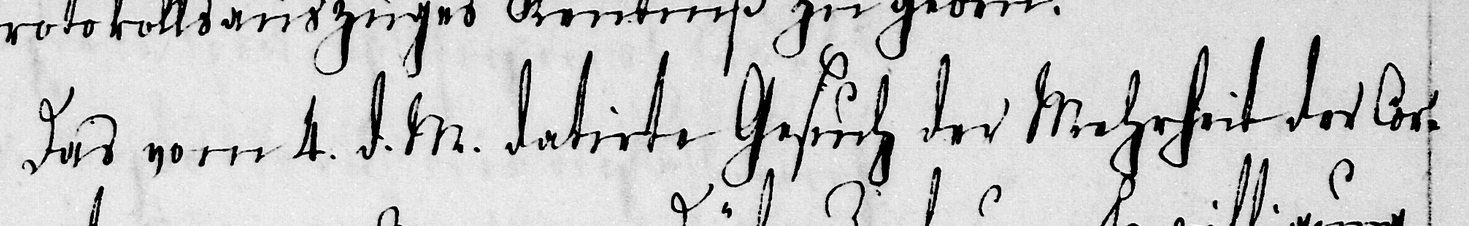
Das vom 4. d. M. datirte Gesuch der Mehrheit der Co¬
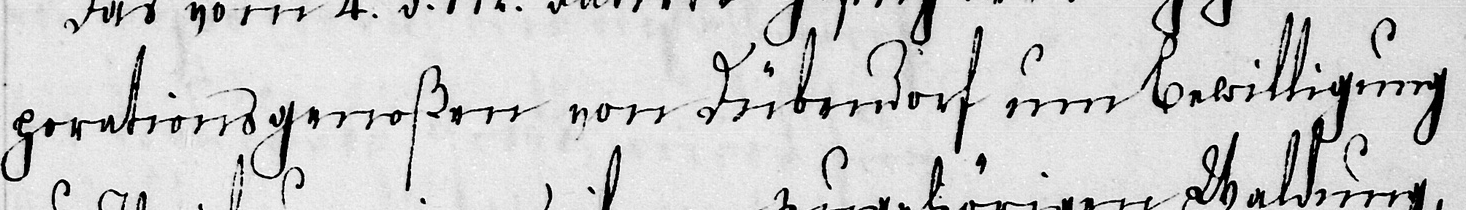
rporationsgenoßen von Dübendorf um Bewilligung
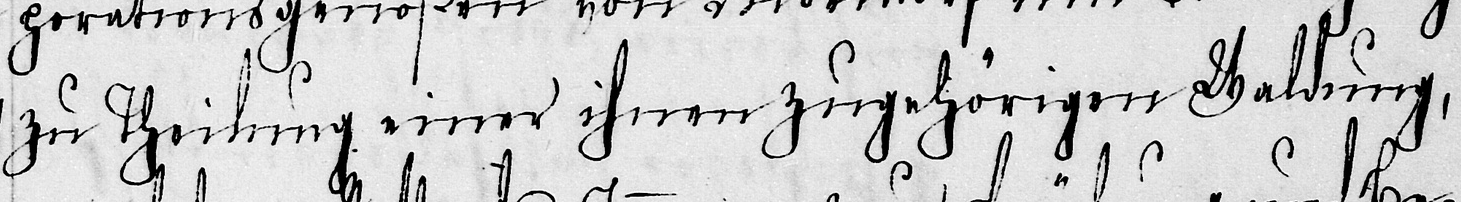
zur Theilung einer ihnen zugehörigen Waldung,
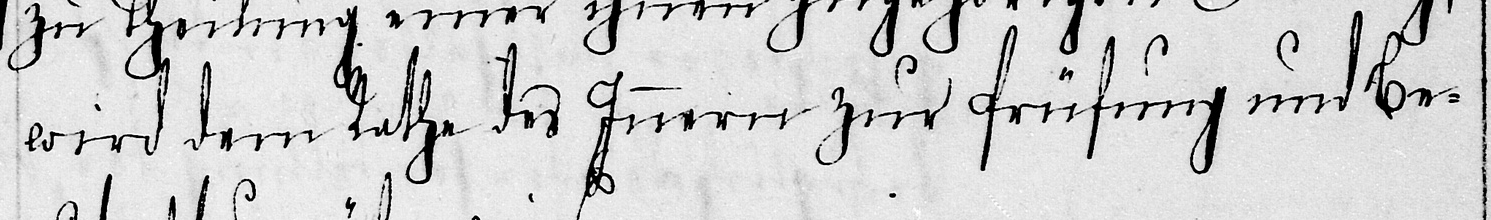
wird dem Rathe des Innern zur Prüfung und Be¬
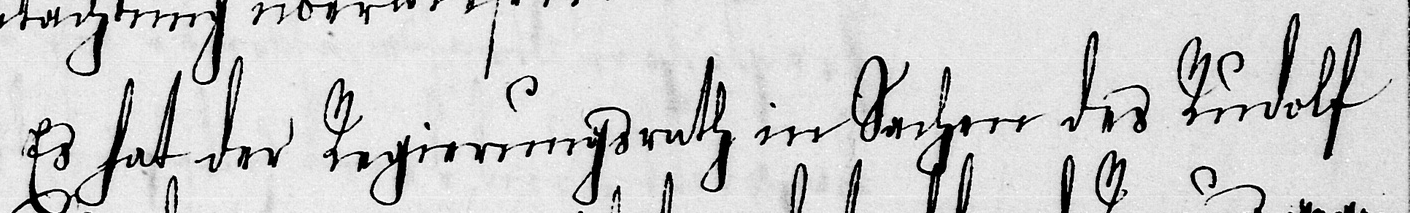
Es hat der Regierungsrath in Sachen des Rudolf
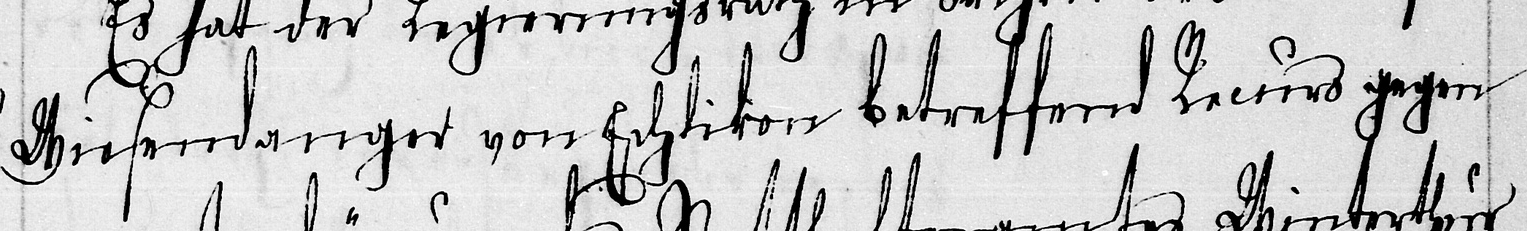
Wiesendanger von Eschlikon betreffend Recurs gegen
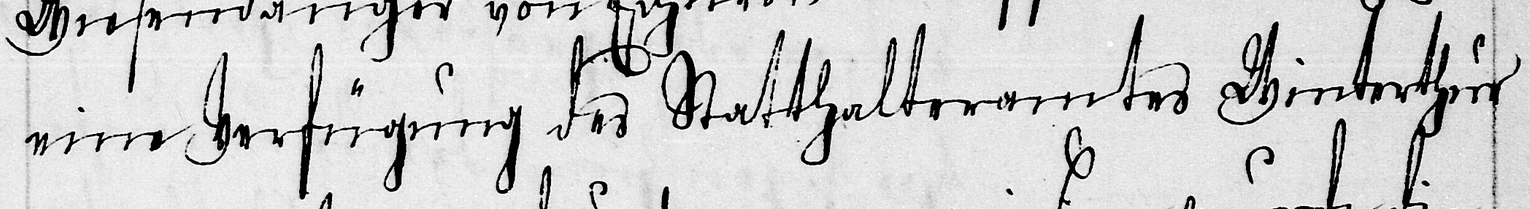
eine Verfügung des Statthalteramtes Winterthur
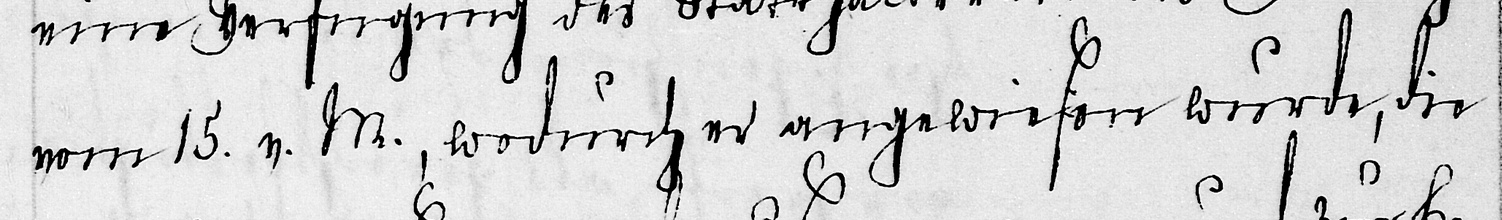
vom 15. v. M., wodurch er angewiesen wurde, die
